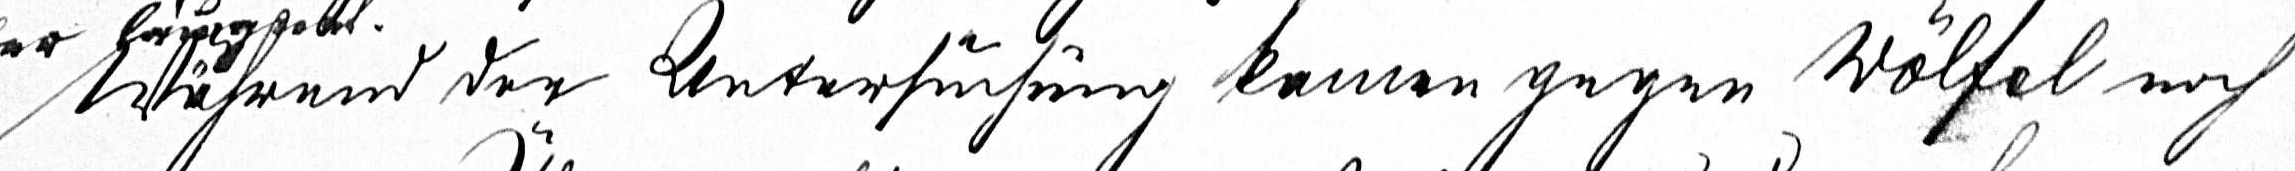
Während der Untersuchung kamen gegen Wölfel noch
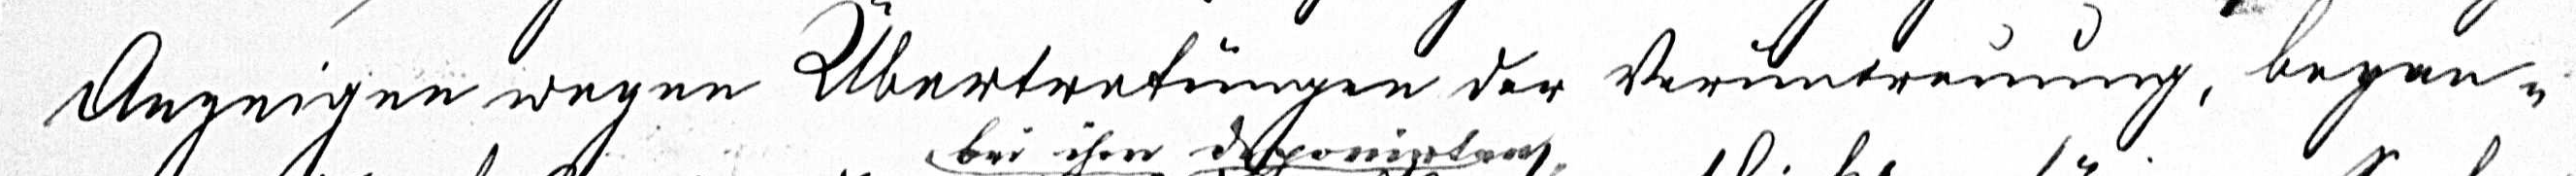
Anzeigen wegen Übertretungen der Veruntrauung, began¬
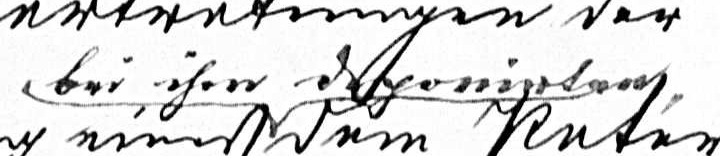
bei ihm deponirten
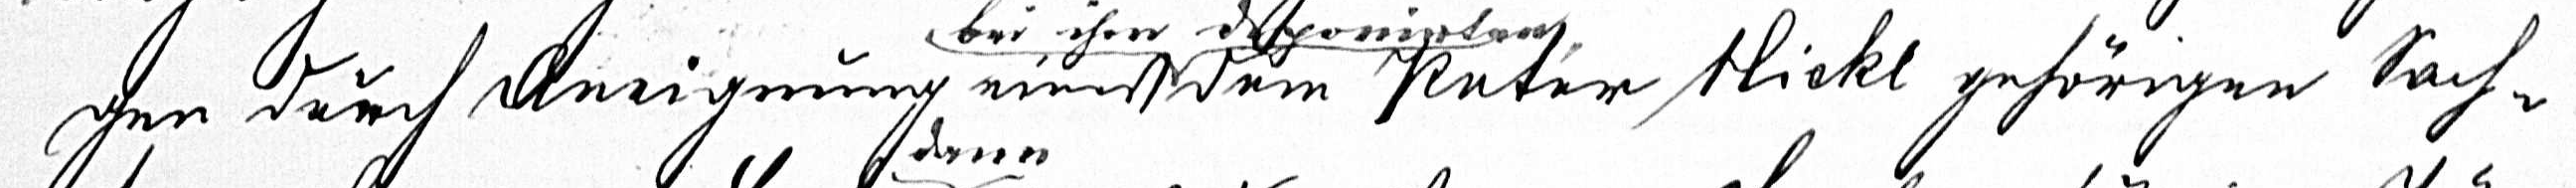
gen durch Aneignung eines dem Peter Nickt gehörigen Sach¬
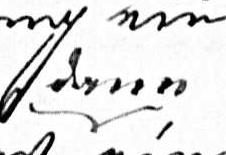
denn
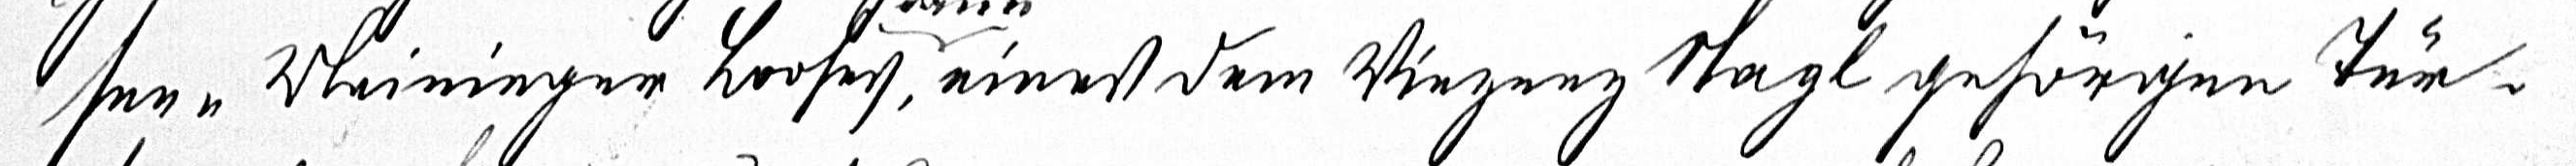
sen-Meininger Looses eines dem Vinzenz Nagl gehörigen Tür¬
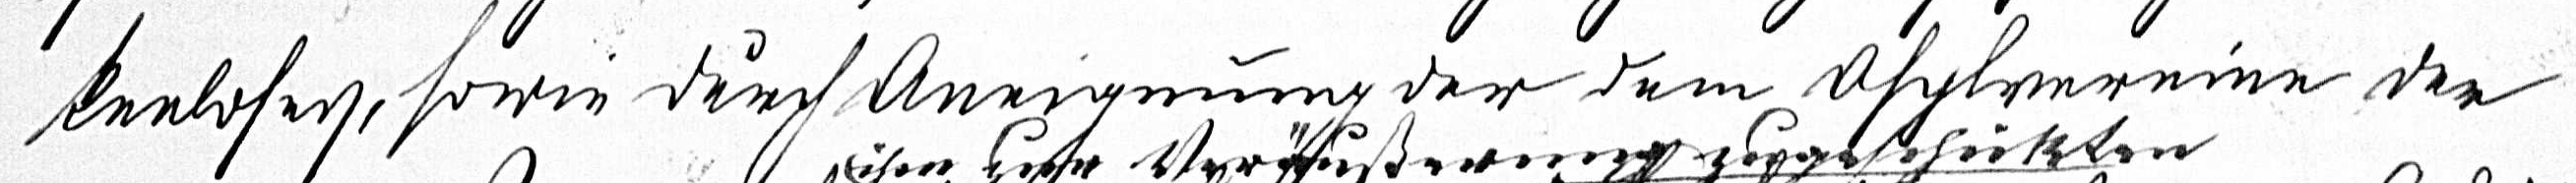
kenloses, sowie durch Aneignung der dem Asylvereine der
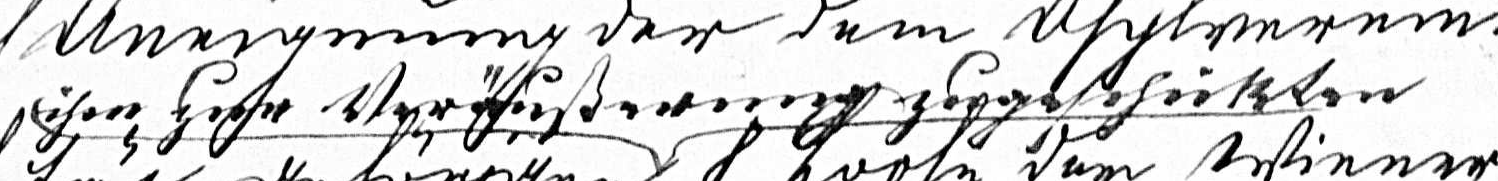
ihre zur Veräußerung zugeschüßten
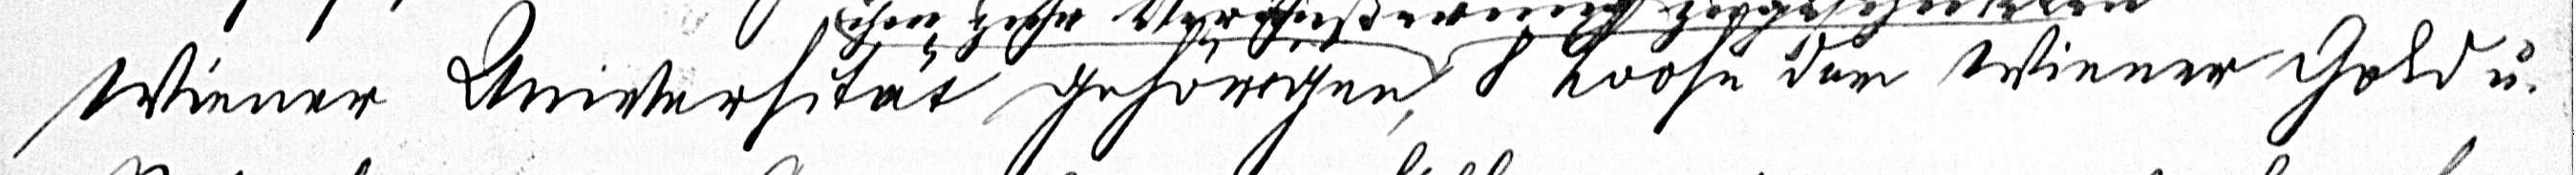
Wiener Universität gehörigen, 8 Loose der Wiener Gold u
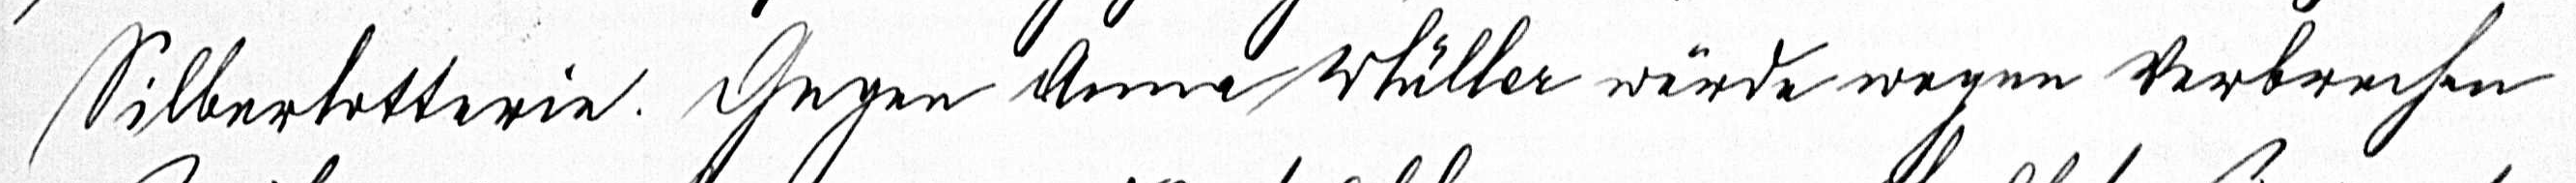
Silberlotterie. Gegen Anna Müller würde wegen Verbrechen
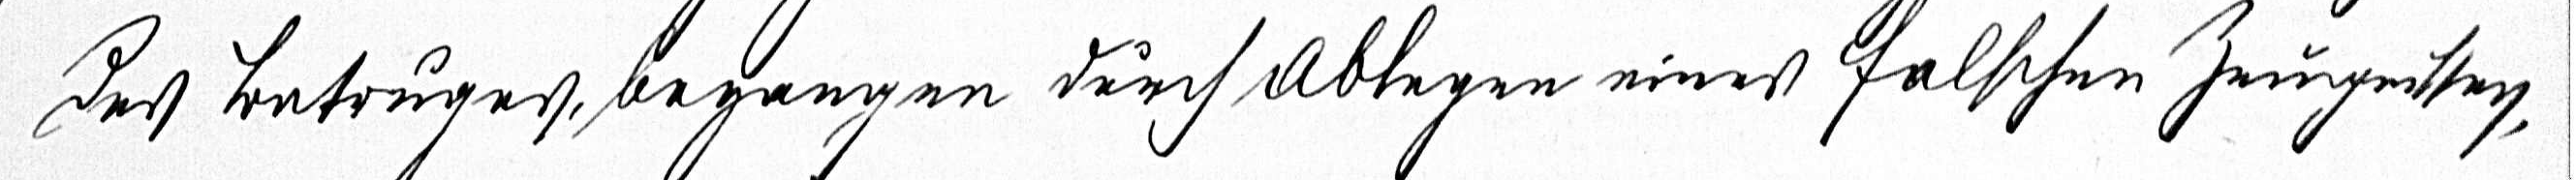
des Betruges begangen durch Ablagen eines falschen Zeugnisses
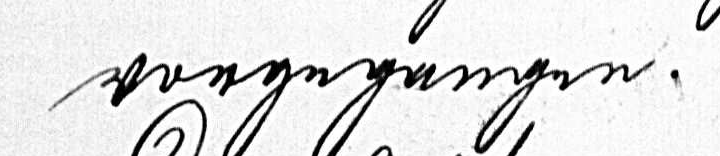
vorgegangen.
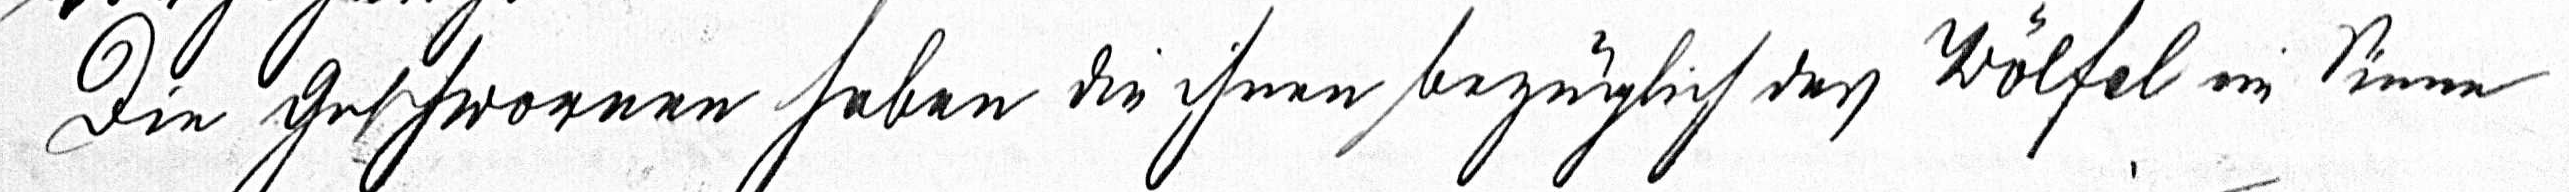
Die Geschwornen haben die ihnen bezüglich des Wölfel im Sinne
